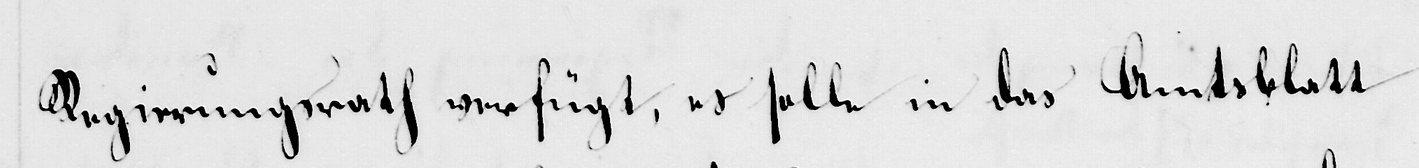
Regierungsrath verfügt, es solle in das Amtsblatt
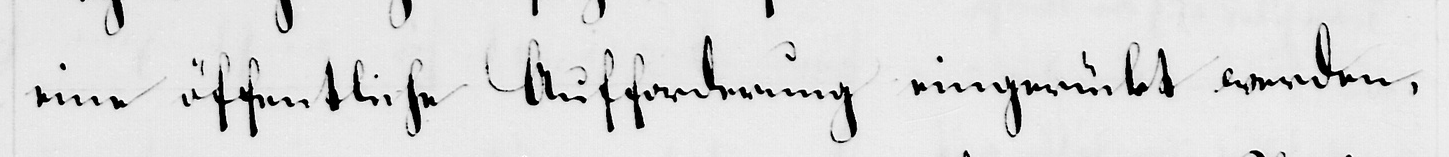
eine öffentliche Aufforderung eingerückt werden,
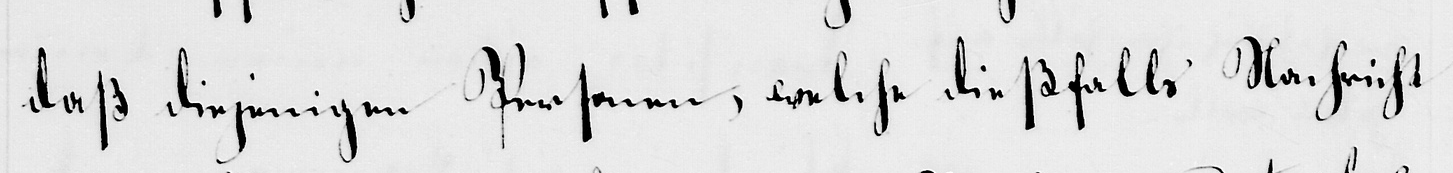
daß diejenigen Personen, welche dießfalls Nachricht
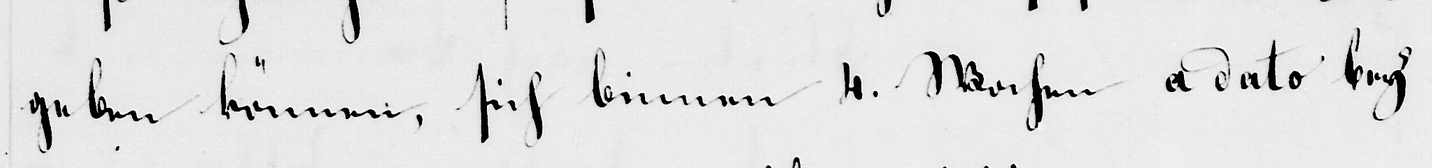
geben können, sich binnen 4. Wochen a dato bey
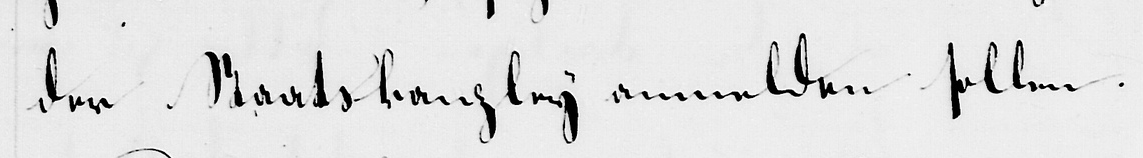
der Staatskanzley anmelden sollen.
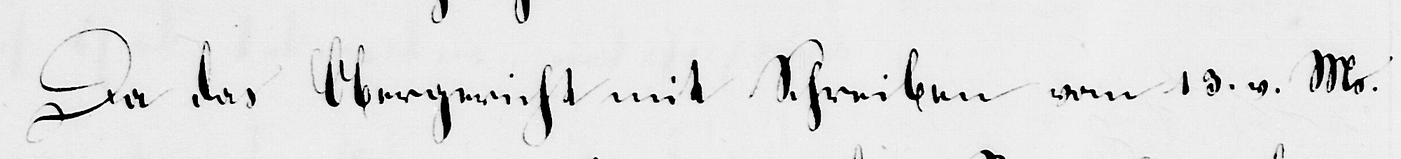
Da das Obergericht mit Schreiben vom 19. v. Ms.
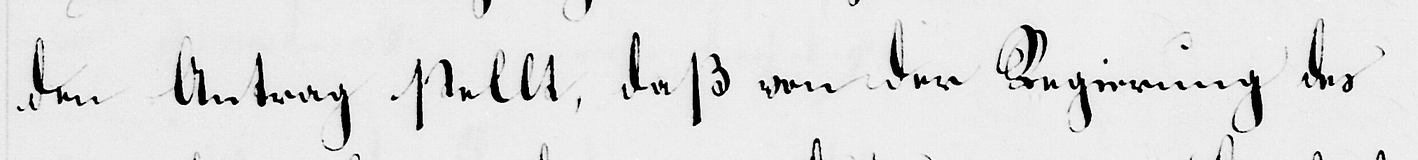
den Antrag stellt, daß von der Regierung des
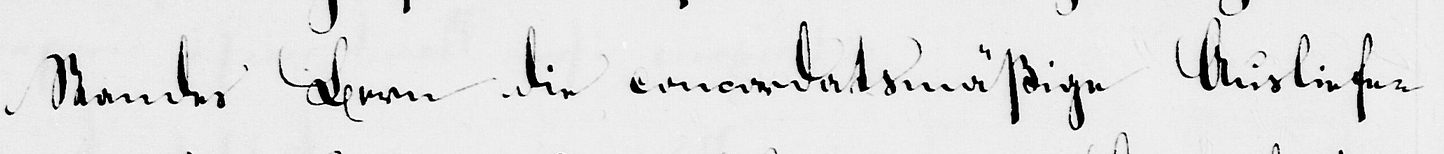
Standes Bern die concordatsmäßige Ausliefe¬
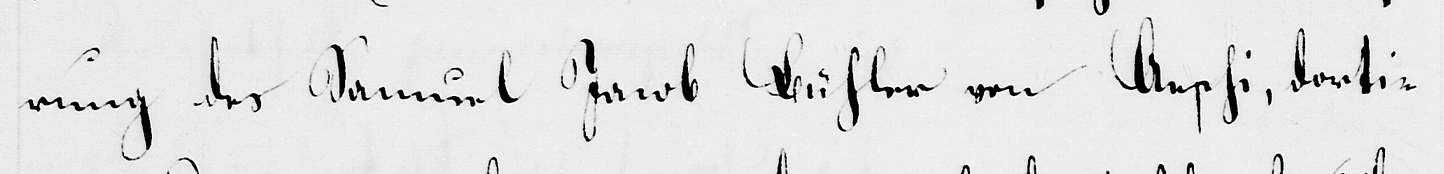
rung des Samuel Jacob Bühler von Aeschi, dorti¬
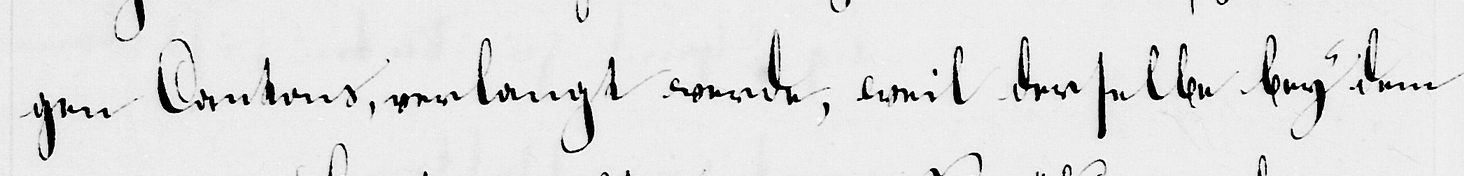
gen Cantons, verlangt wurde, weil derselbe bey dem
